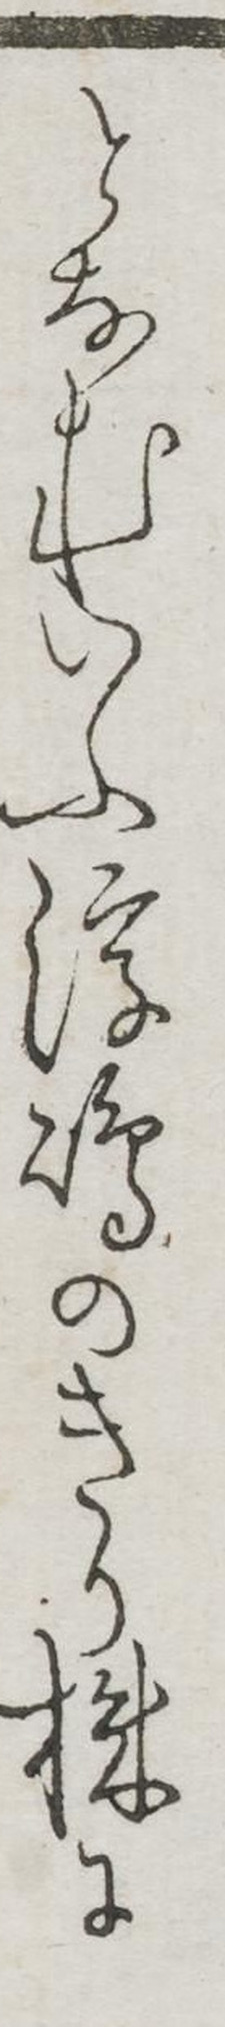となむいふ浮島のきり株に

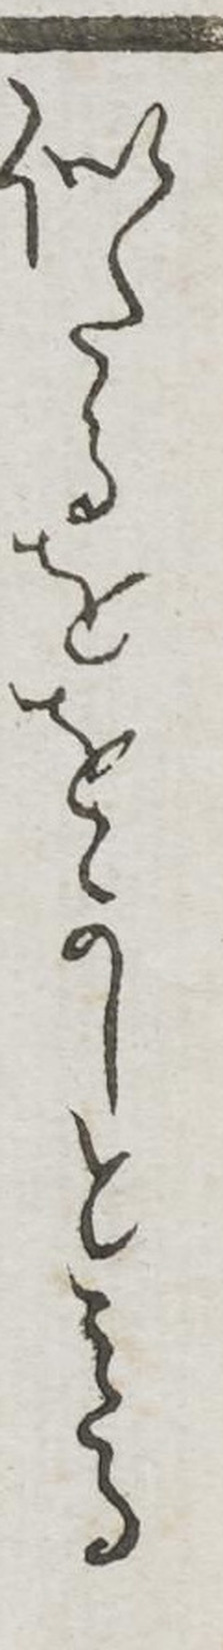似たるををかしとみる
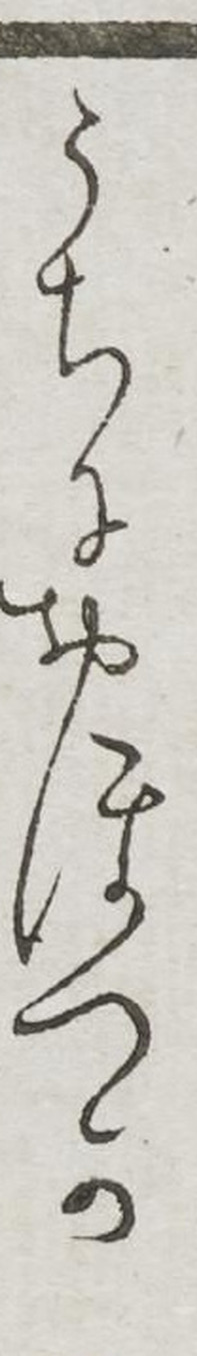うちにおほつか
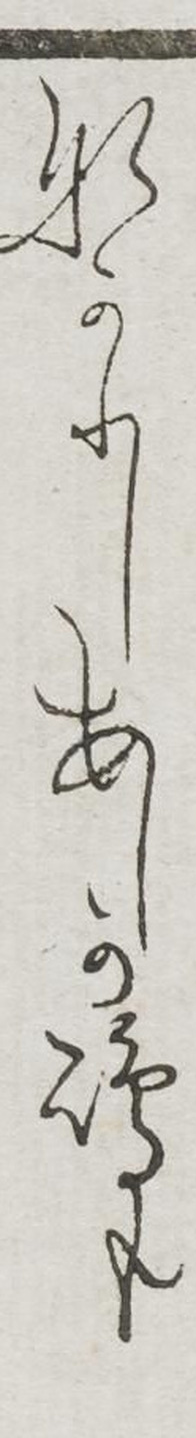なかりしあしか嶋も
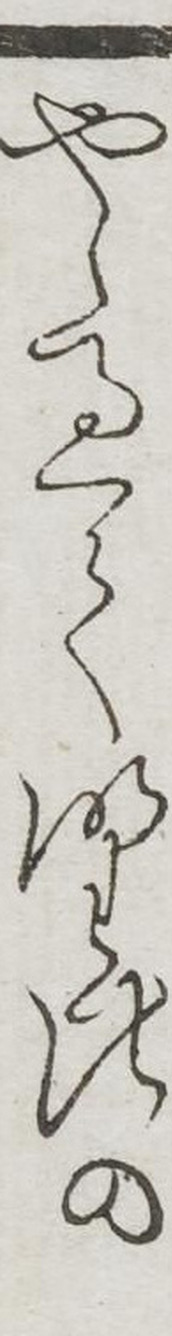やゝ過て野比の
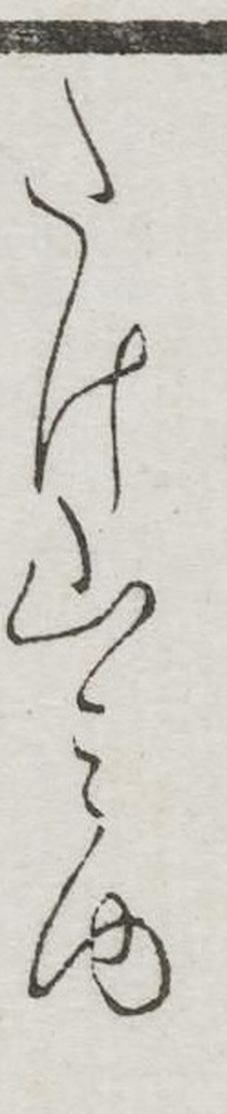たけ山みゆ
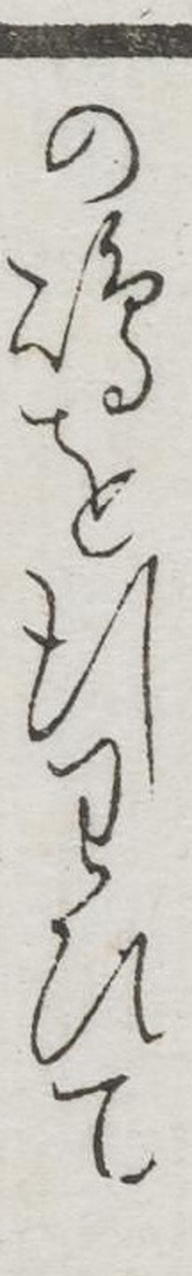の嶋を行わひて
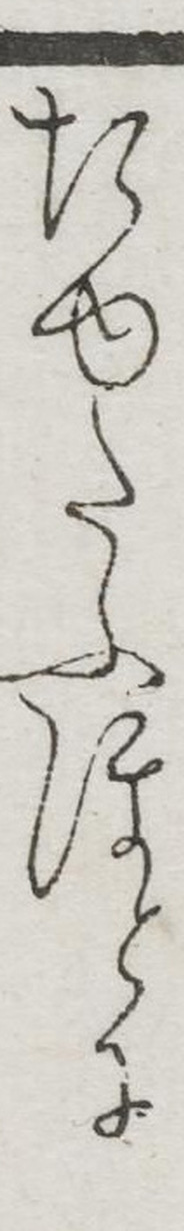たゆたふほとに
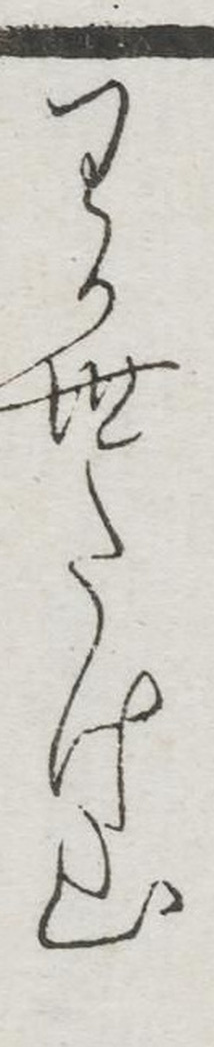わか世たけ山
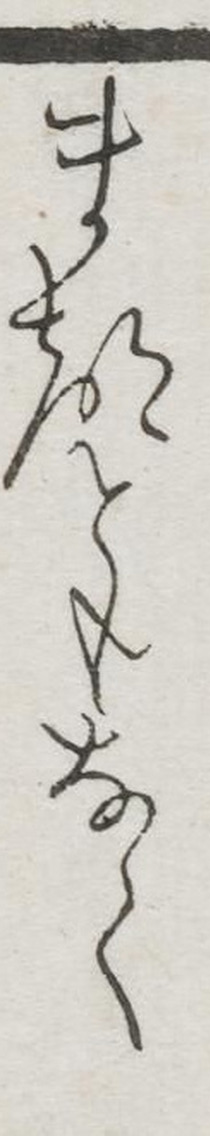まつともなく
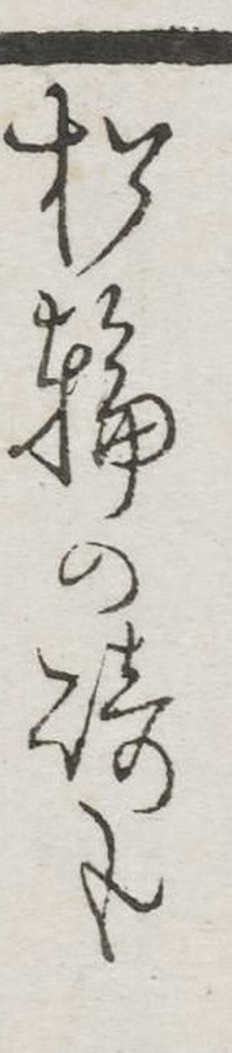松輪の崎も
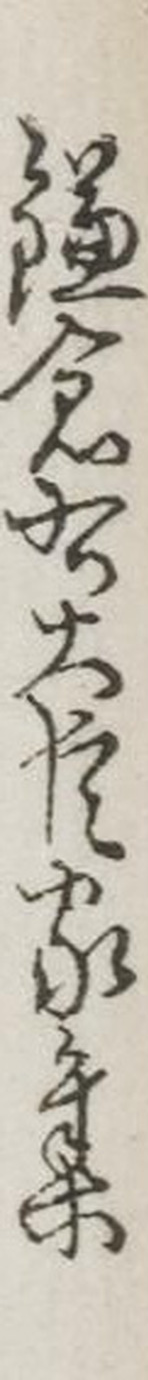鎌倉右大臣家集
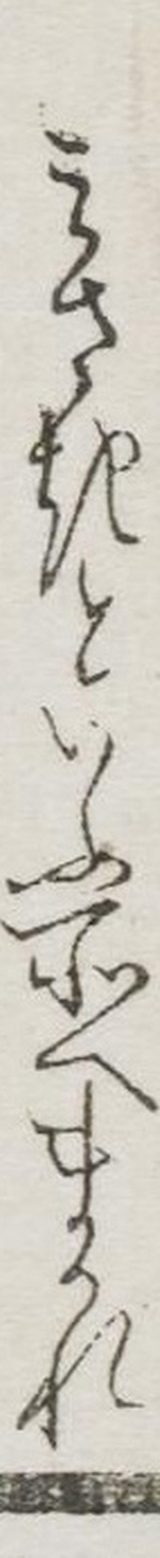みさきといふ処へまかれ
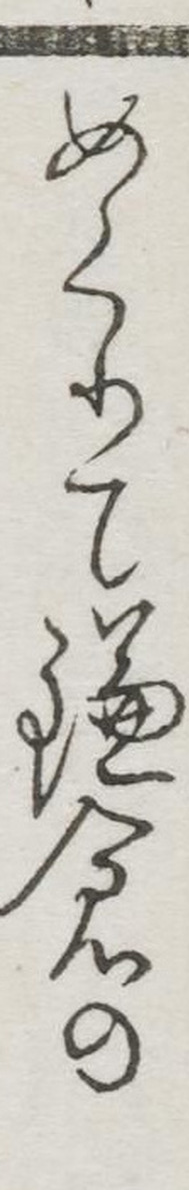めくりて鎌倉の
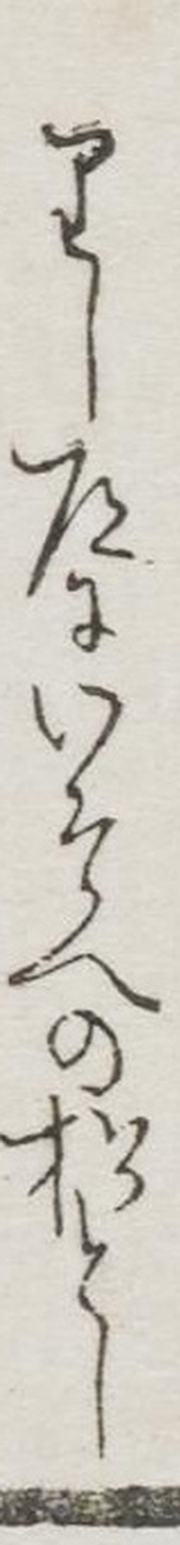りし道にいそへの松とし
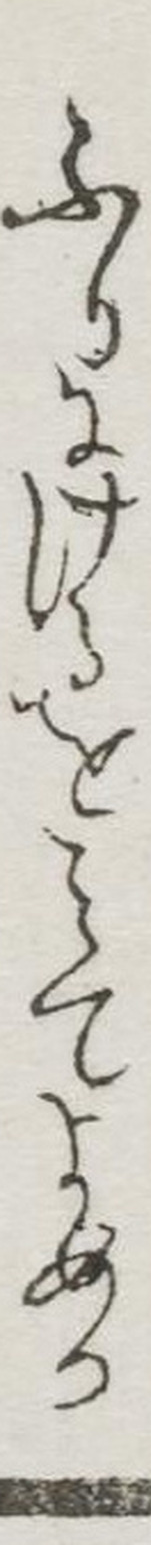ふりにけるをみてよめる
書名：挿画熱海日記　全
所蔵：東京大学地震研究所図書室 Earthquake Research Institute Library, The University of Tokyo, JAPAN
